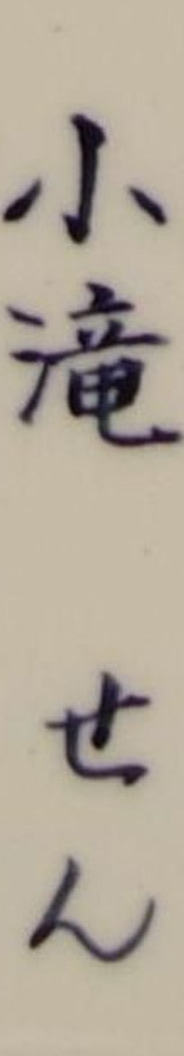小滝せん
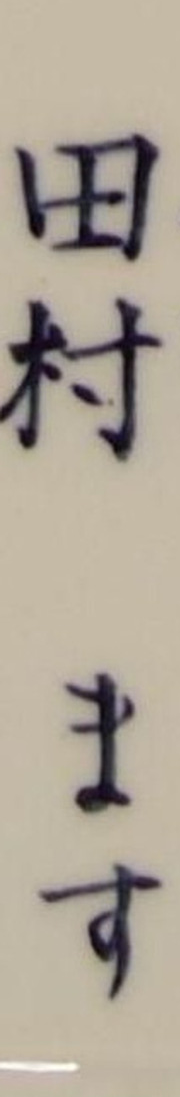田村ます
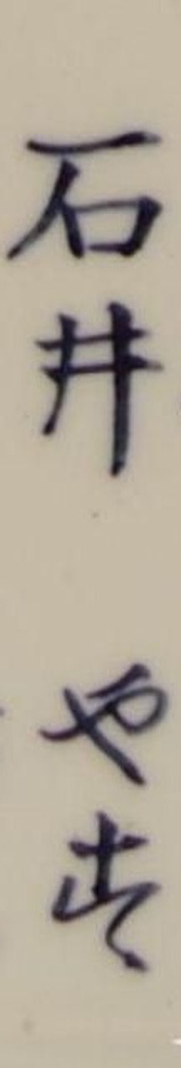石井やす
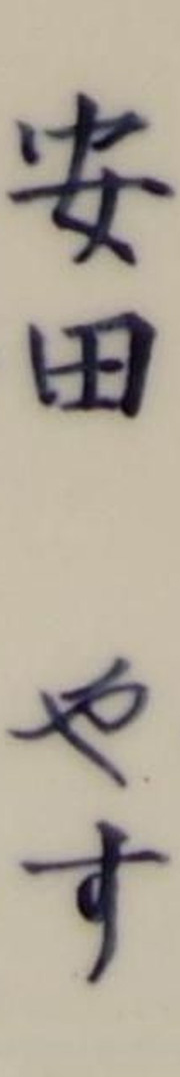安田やす
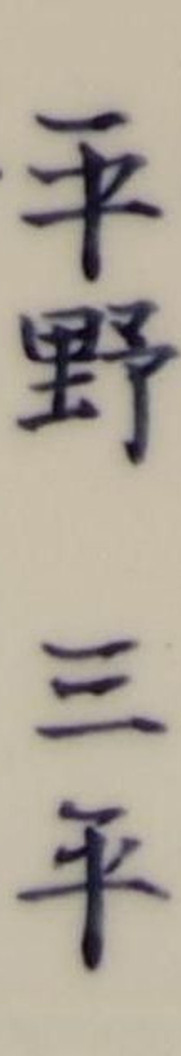平野三平
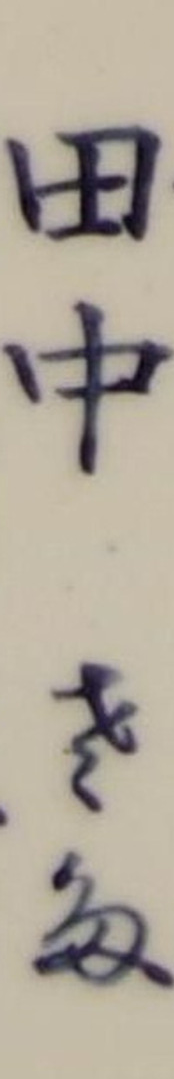田中さた
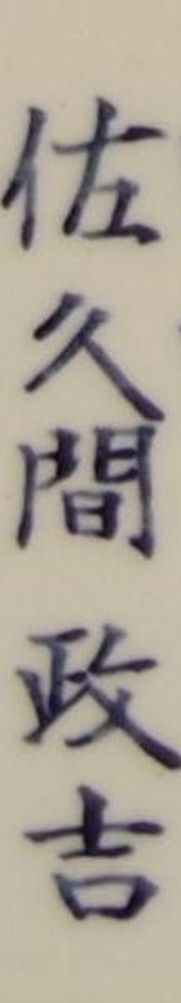佐久間政吉

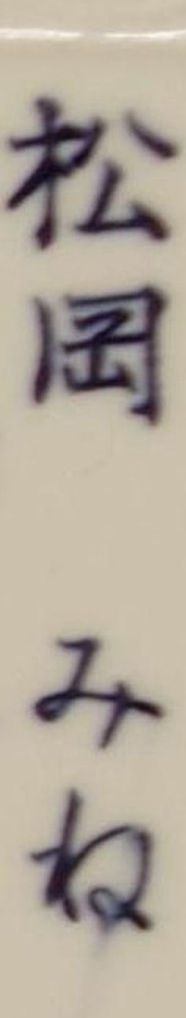松岡みね
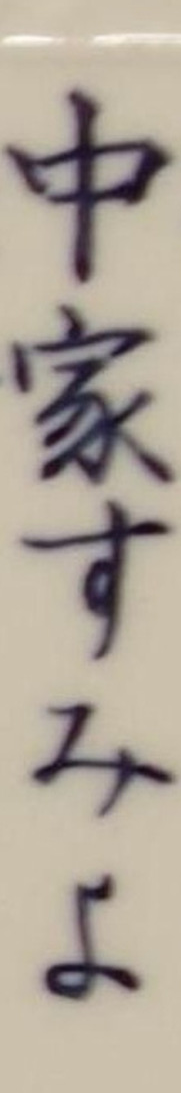中家すみよ
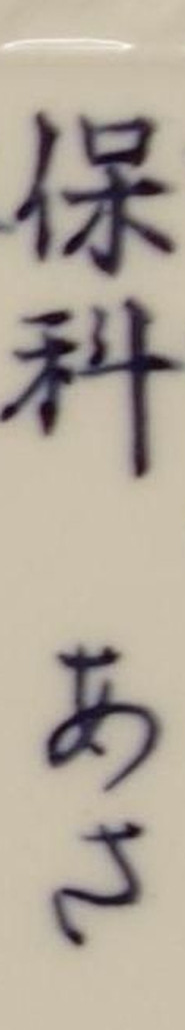保科あさ
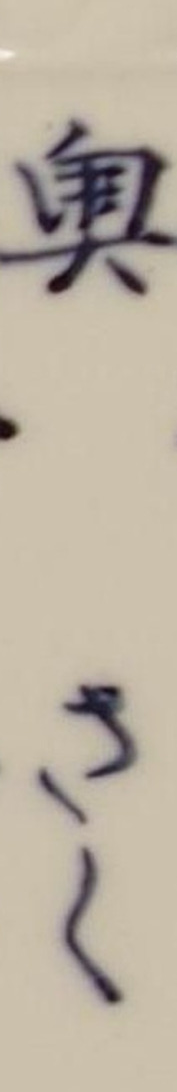奥さく
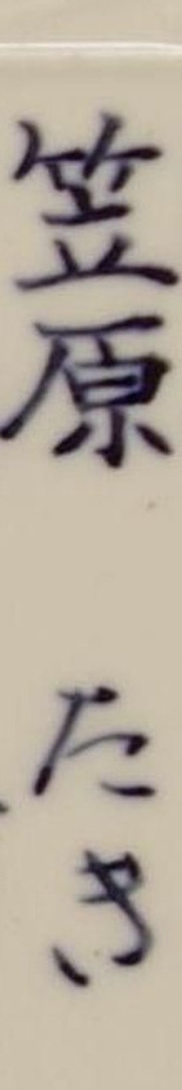笠原たき
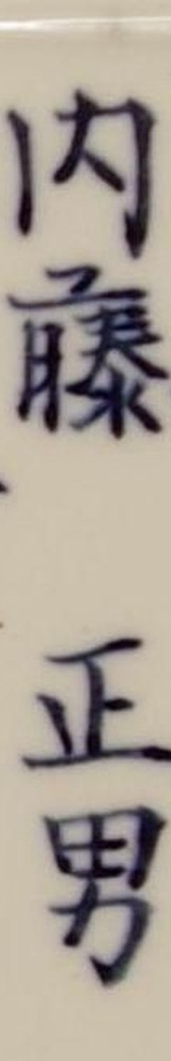内藤正男
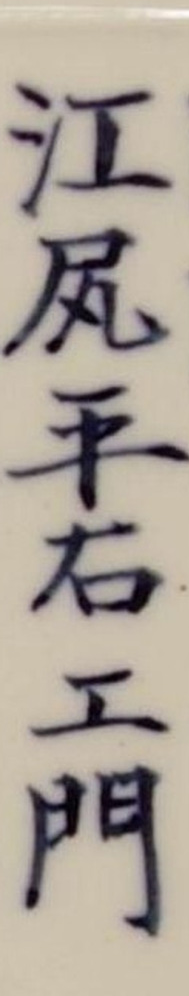江尻平右エ門
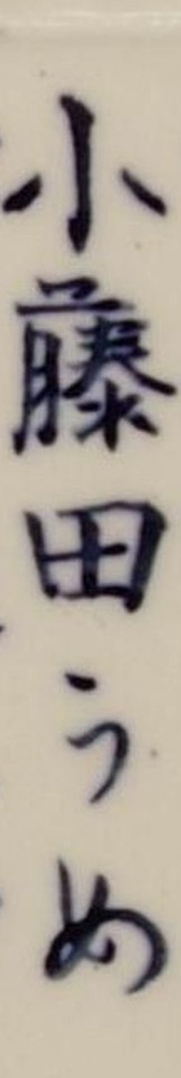小藤田うめ
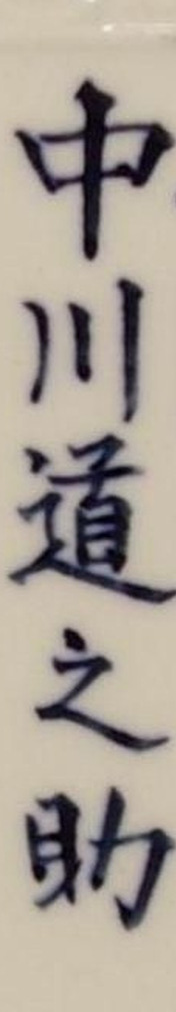中川道之助
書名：E~L
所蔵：高野山金剛峯寺
